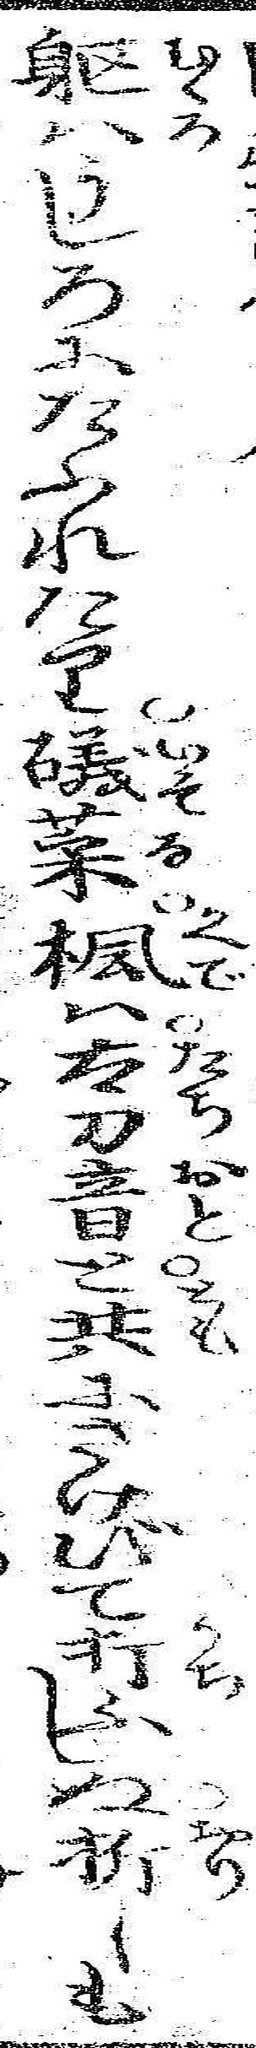躯はうしろにたふれたり。礒菜。楓は。太刀音と。共にさけびて打ふしぬ。折しも
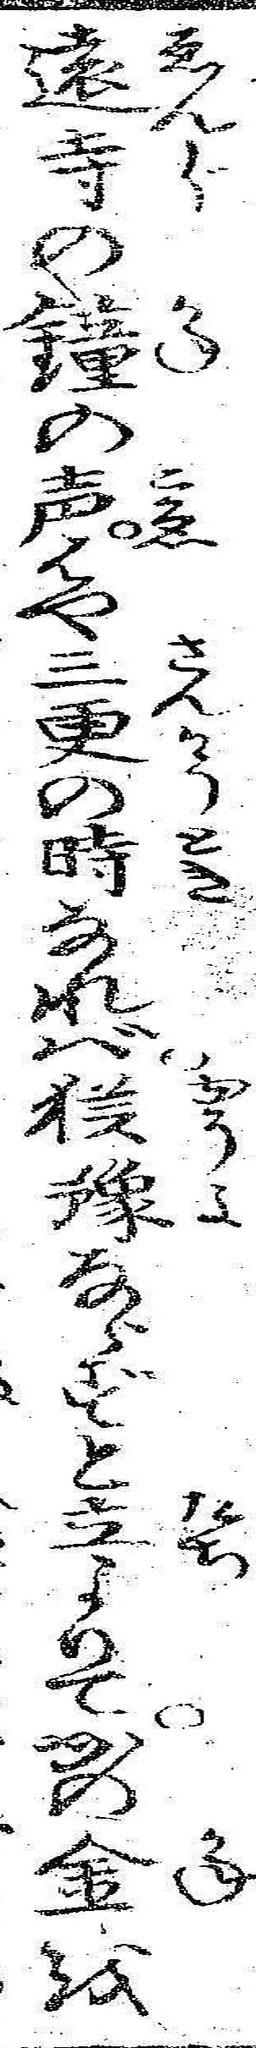遠寺の鐘の声。はや三更の時なれば。猶予ならずと立よりて。かの金を
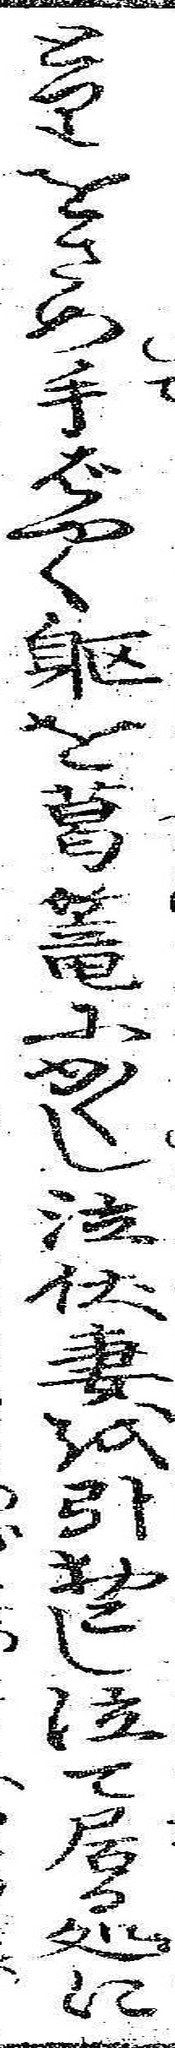とりをさめ。手ばやく躯を葛篭にかくし。泣伏妻を引おこし。泣て居る処に
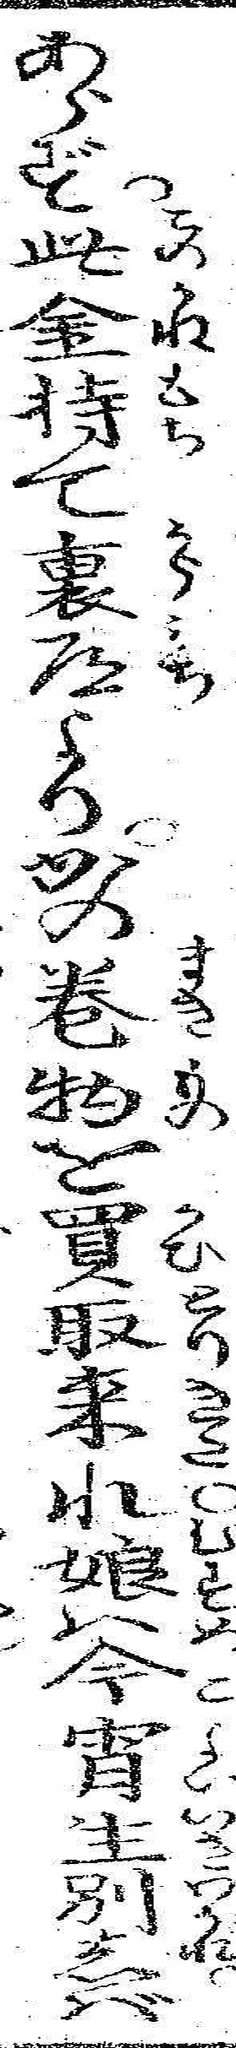あらず。此金持て裏道より。かの巻物を買取来れ。娘は今宵生別。しば
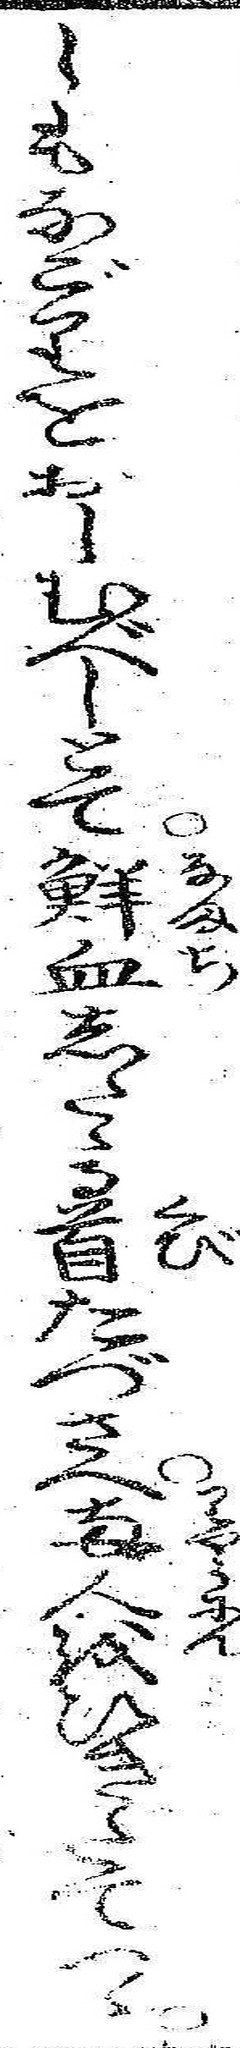しもなごりをおしむべしとて。鮮血したゝる首たづさへ。両人をひきたてつゝ。
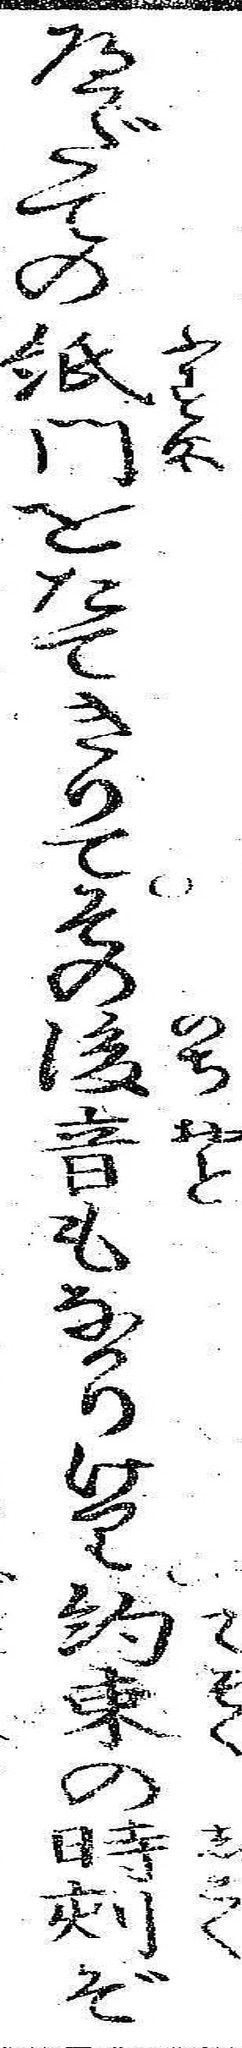へだての紙門をたてきりて。その後音もなかりけり。約束の時刻ぞ
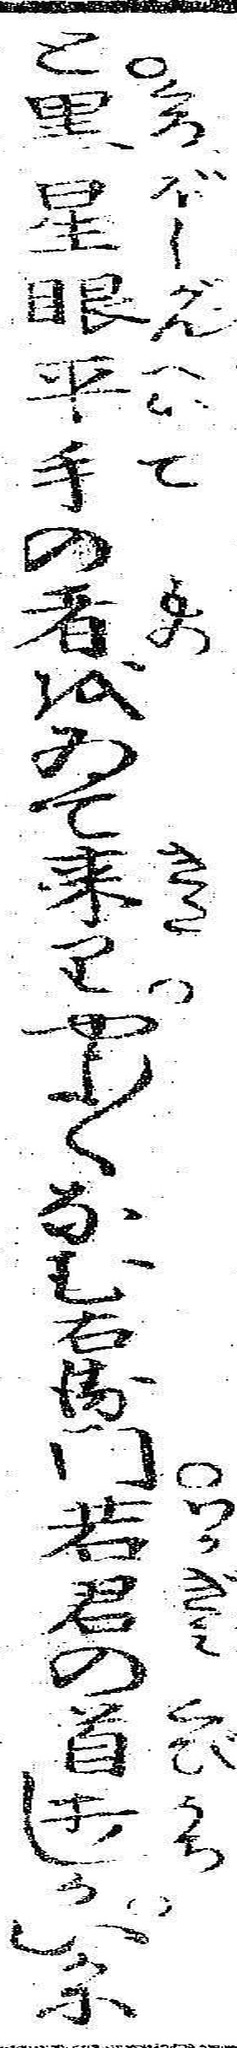と。里星眼平手の者をゐて来り。やよ〳〵なむ右衛門。若君の首打しか。いかに
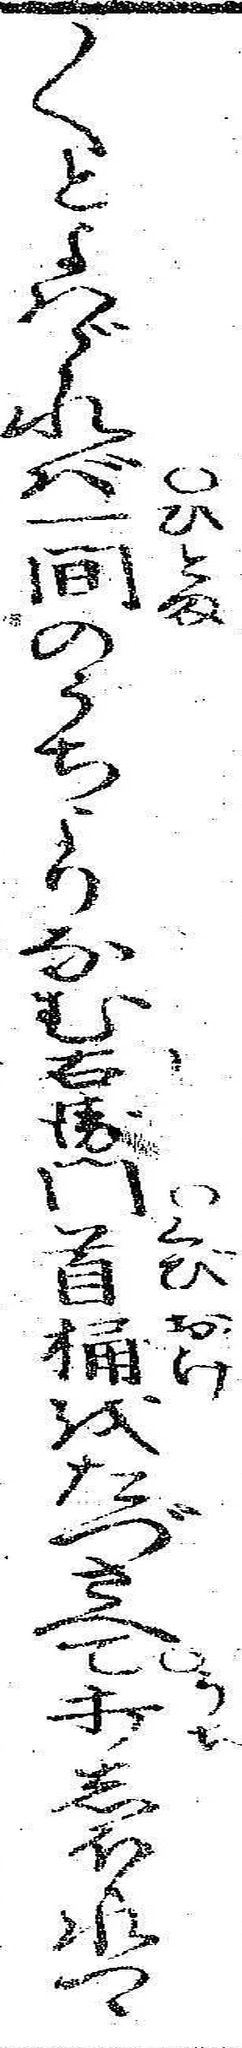〳〵とよはゞれば。一間のうちよりなむ右衛門。首桶をたづさへて。打しほれつゝ
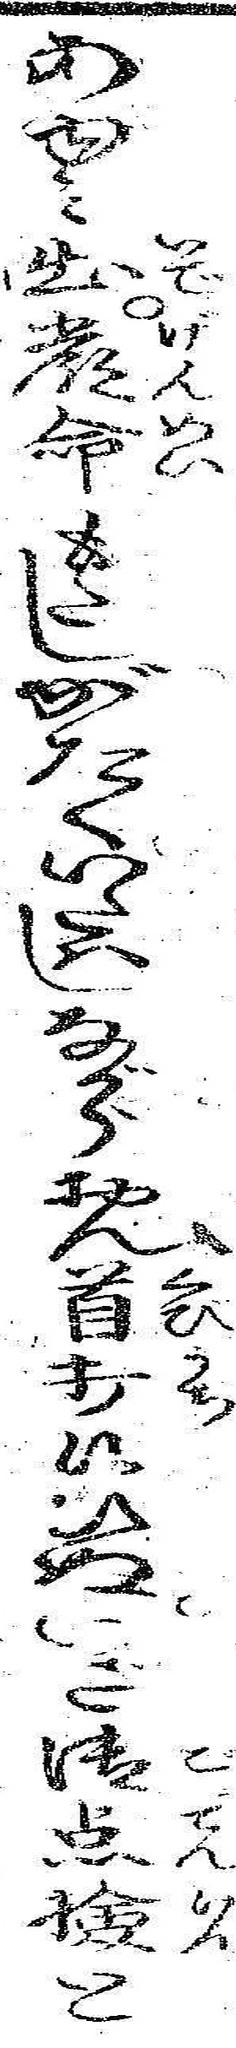あゆみ出。厳命もたしがたく。いたはしながらおん首打候ひぬ。いざ御点検と
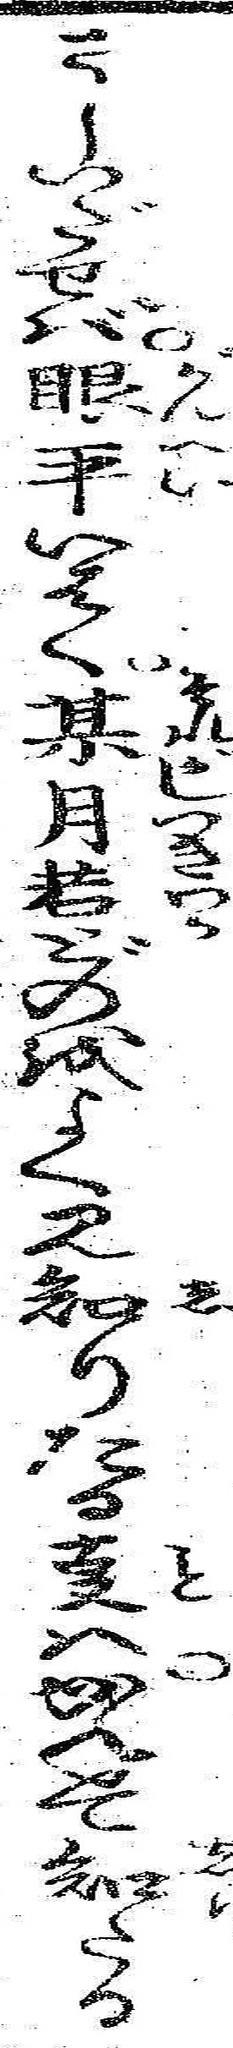さしいだせば。眼平いはく。某月若どのをよく見知りたる事は。かねて知たる
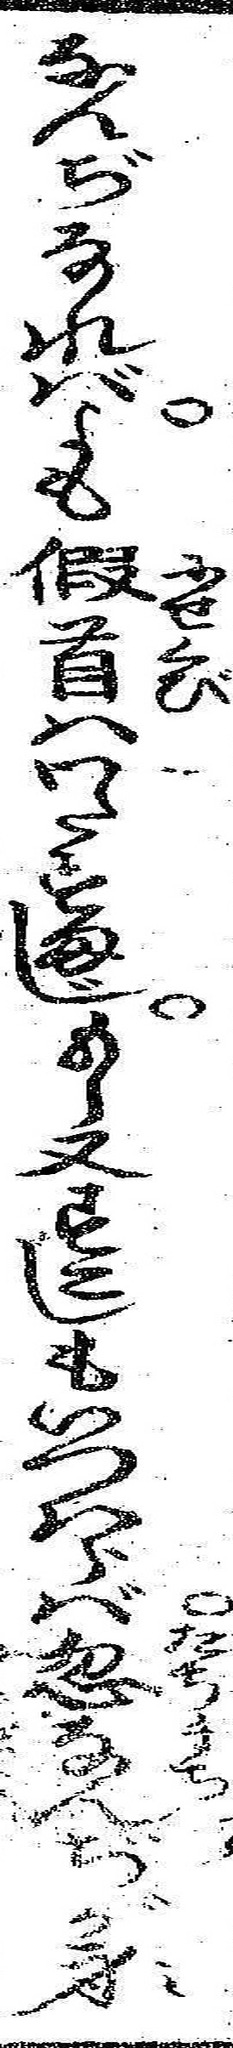なんぢなれば。よも仮首はわたすまじ。もし又すこしもいつはらば。忽なんぢが身
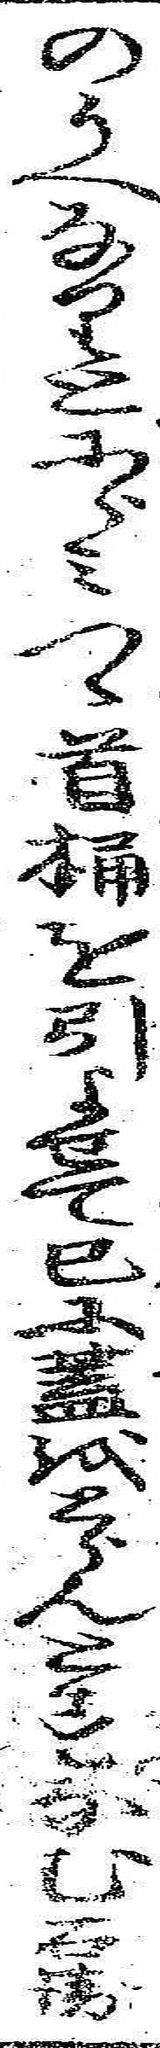のうへなりと。にらみつゝ。首桶を引よせて。已に蓋をとらんとす。なむ右衛
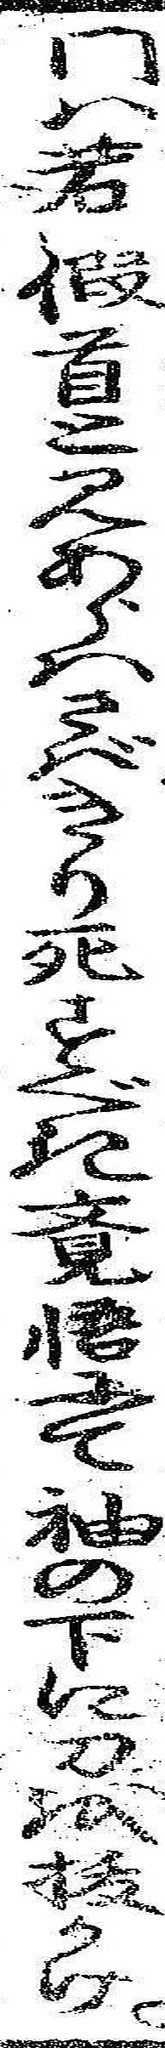門は若仮首と見あらはさば。きり死すべき斍悟にて。袖の下に刀を抜かけ。
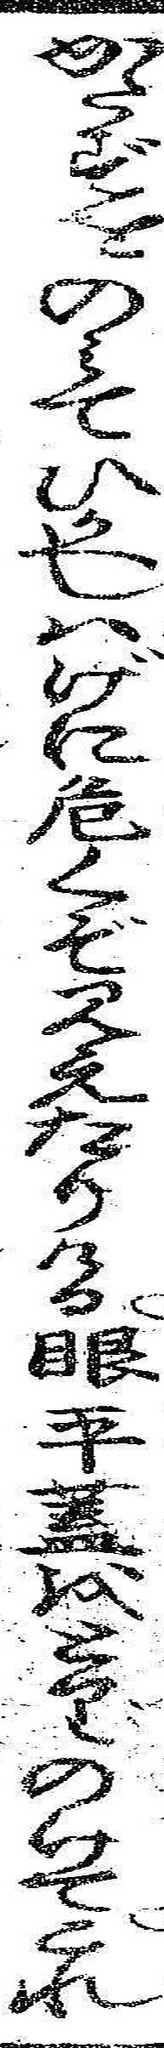かたずをのみてひかへしは。げに危くぞ見えたりける。眼平蓋をとりのけて。これ
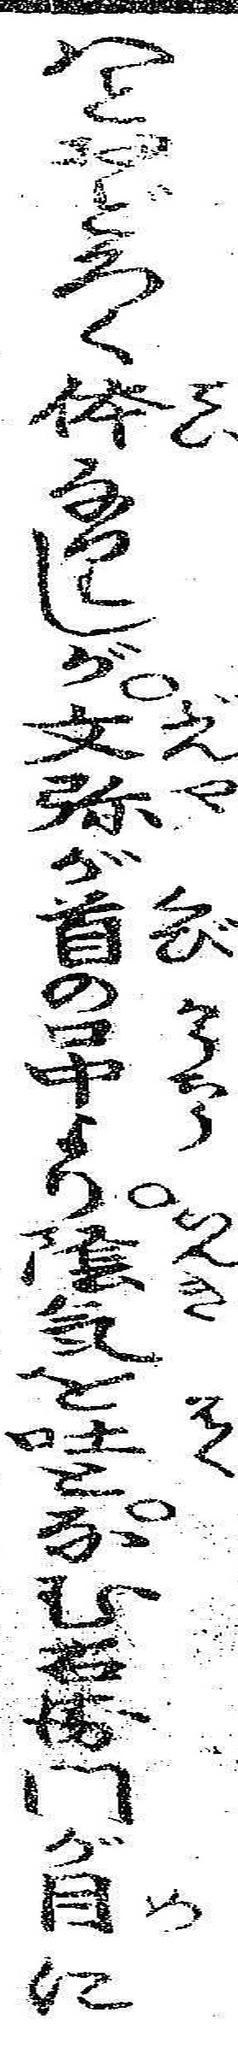はとおどろく体なりしが。文弥が首の口中より。陰気を吐と。なむ右衛門が目に
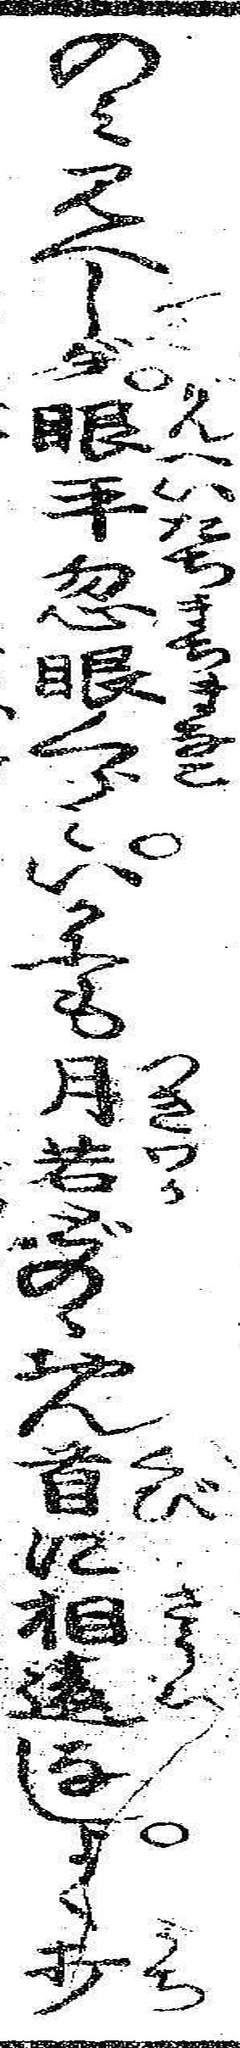のみ見へしが。眼平忽眼くらみ。いかにも月若どのゝおん首に相違なし。よく打
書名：昔話稲妻表紙
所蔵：国文学研究資料館
